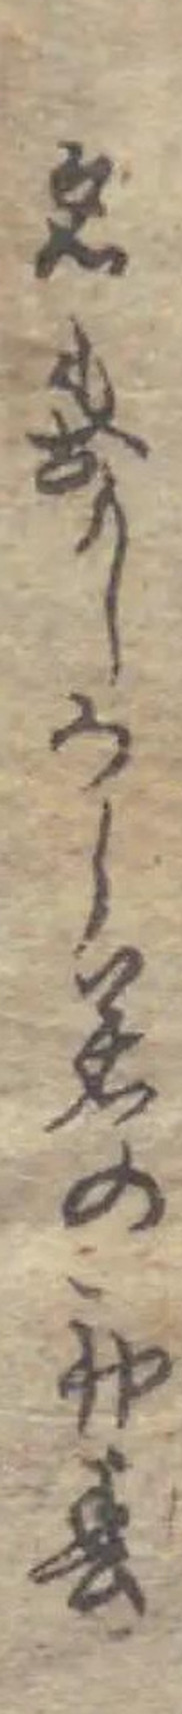名もおもしろし若の初春
